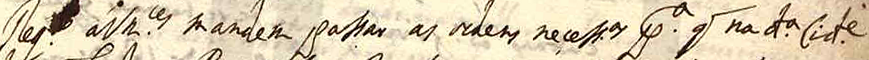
Req._ a V m.ces mandem passar as ordens necess.as p.a q̄ na d̄.a Cid̄.e
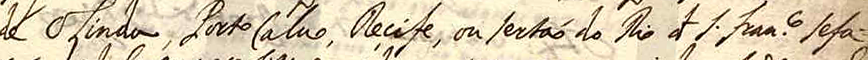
de OLinda, Porto Caluo, Recife, ou Sertaõ do Rio d̄ s. fran.co se fa
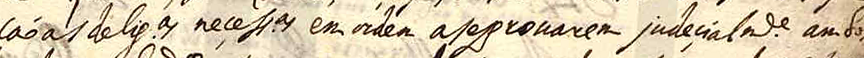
çaõ as delig.as necess.as em ordem a se prouarem judeçialm.te ambos
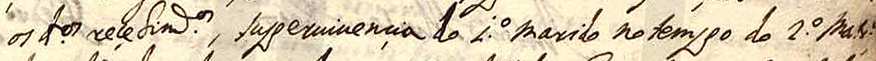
os d̄.os recebim̄.os, superuiuencia do i.o marido no tempo do 2.o matr.
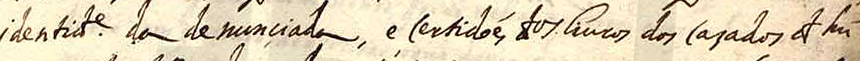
jdentid.e da denunciada, e certidões d̄os liuros dos casados d̄ hū
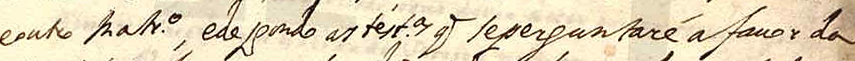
e outro matr.o, e depondo as test.as q̄ se perguntarē a fauor da
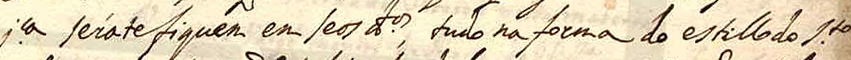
j.ca serátefiquem em seos d̄.os, tudo na forma do estillo do s.to
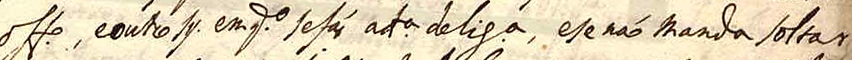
off.o, e outrosy. emq̄.o se fás a d̄.a delig.a, e se naõ manda soltar
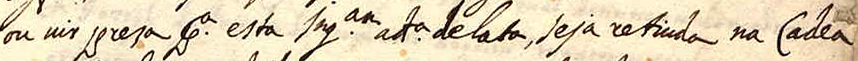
ou uir preza p̄.a esta Inq.am a d̄.a delata, seja retiuda na Cadea
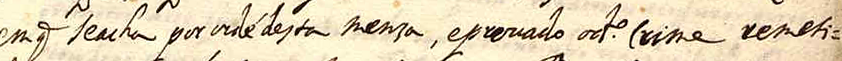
em q̄ se acha por ordē desta menza, e prouado o d̄.o Crime remeti
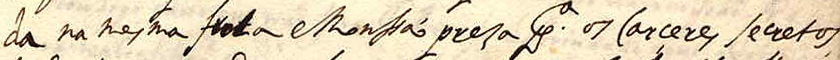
da na mesma frota e monssaõ preza p̄.a os Carceres secretos
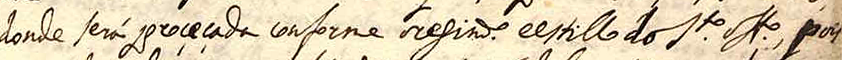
donde será proceçada conforme o regim.to e estillo do sto. off.o, pois
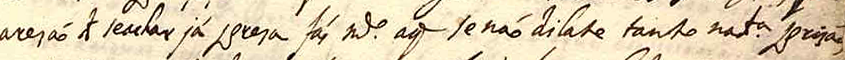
a rezão d̄ se achar já preza fás m.to a q̄ se naõ dilate tanto na d̄.a prizaõ
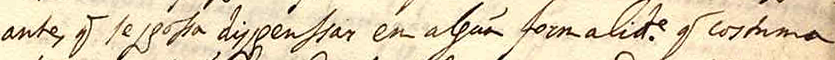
antes, q̄ se possa dispenssar em algūa formalid̄.e q̄ costuma
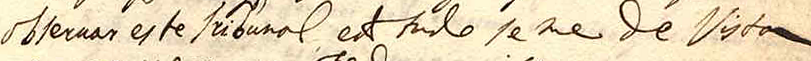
obseruar este Tribunal e d̄ tudo se me de Vista
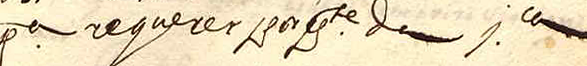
p.a requerer por p.te da j.ca
